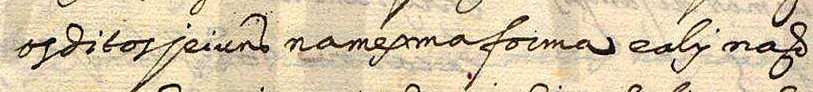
os ditos jeiuns na mesma forma e aly naõ
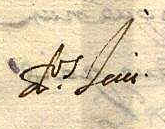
d.os Ieiū.
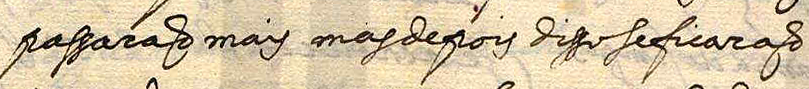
passaraõ mais mas depois disso se ficaraõ
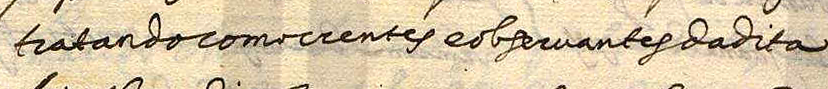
tratando como crentes e obseruantes da dita
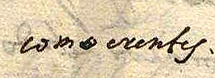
como crentes
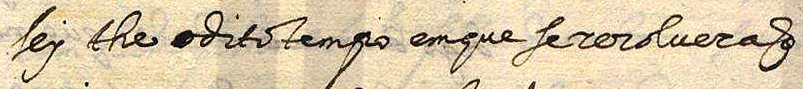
ley the o dito tempo em que se rezolueraõ
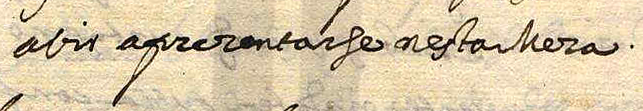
a vir aprezentarse nesta Meza.
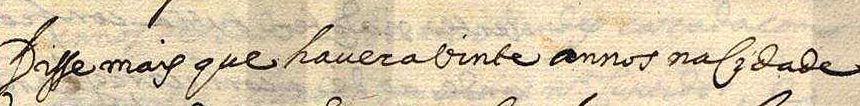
Disse mais que hauera vinte annos na Cidade
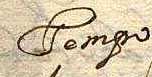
Tempo
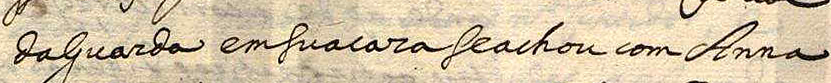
da Guarda em sua caza se achou com Anna
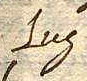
Lug
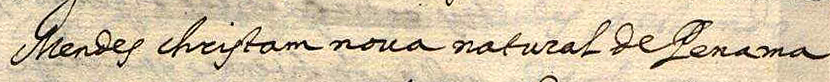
Mendes christam noua naturaL de Penama
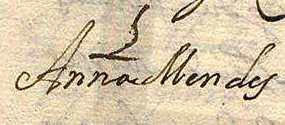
Anna Mendes
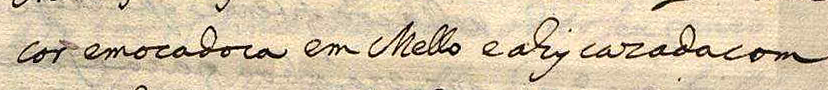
cor e moradora em Mello e ahy cazada com
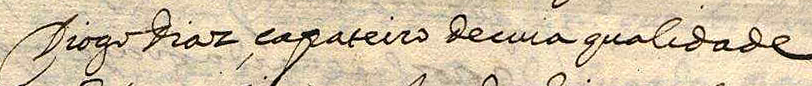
Diogo Diaz çapateiro de cuia qualidade
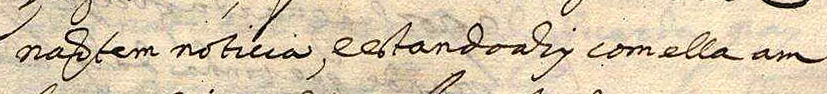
naõ tem noticia, e estando ahy com ella am
